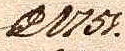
d̄ 1751.
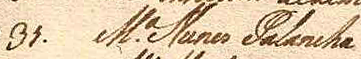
37. M.a Nunes Palancha
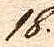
18.
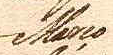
Março
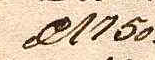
d̄ 1750.
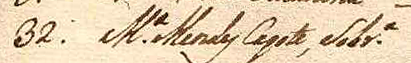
32. M.a Mendes Capote, Sobr.a
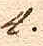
4.
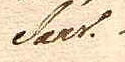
Ianr.o
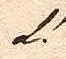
d.o
